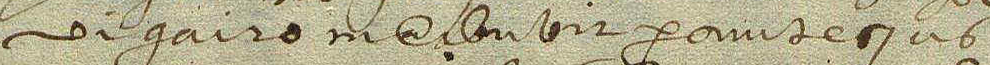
vigairo mādou vir ꝑamte sj as
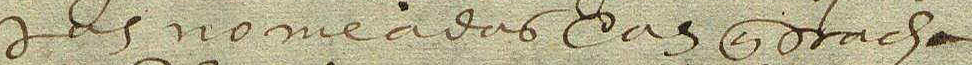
tas nomeadas e as q̄ se acha
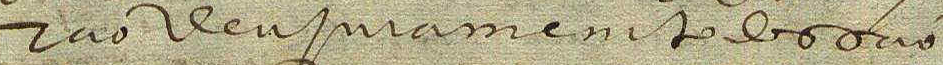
raõ deu juramemto dos saõ
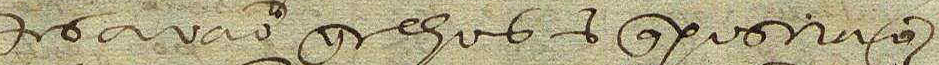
tos avaõgelhos ē q̄ poseraõ
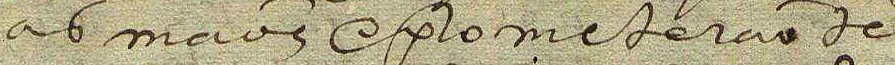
as maõs e prometeraõ ter
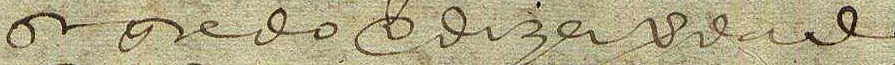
segredo e dizer ꝟdade
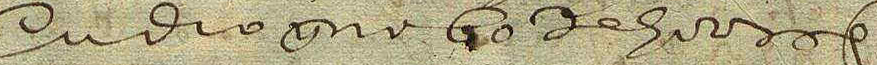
eu dioguo botelho o esp̄j
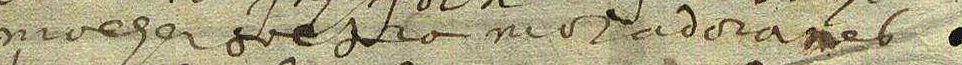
molher soltera moradora nes
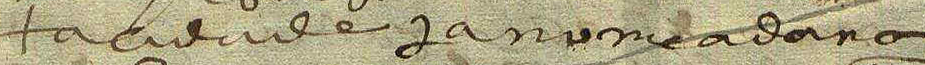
ta cidade ta nomeada na
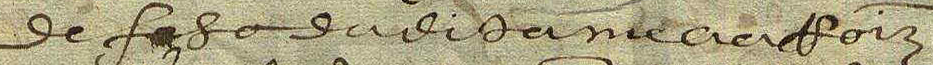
defesa da dita mecia Roīz
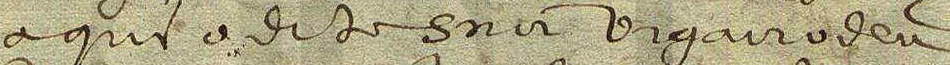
a quē o dito snor̄ vigairo deu
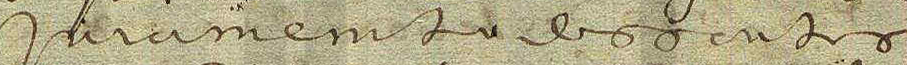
Juramemto dos santos
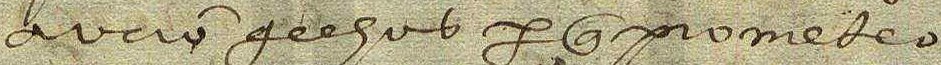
avaõgelhos ꝑ q̄ prometeo
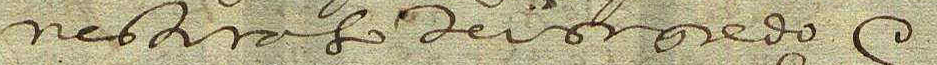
neste caso ter segredo e
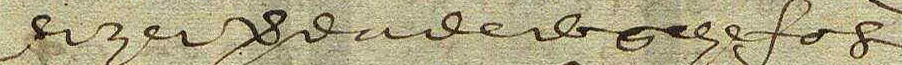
dizer ꝟdade do q̄ lhe fose
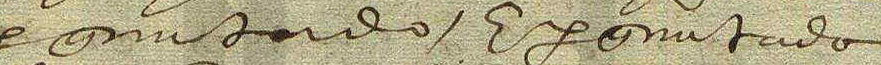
ꝑgumtado / E ꝑguntado
